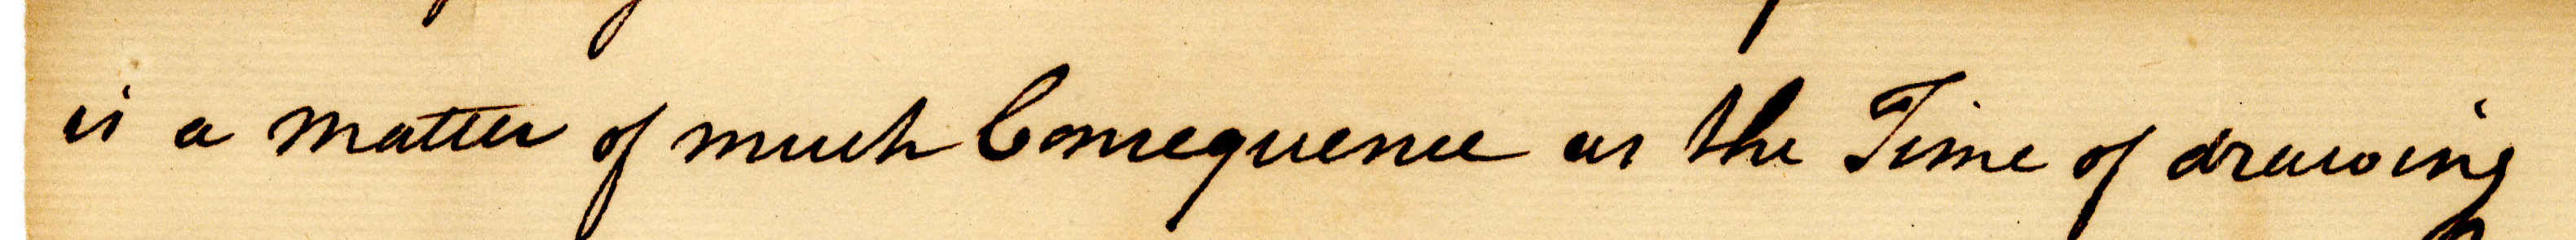is a matter of much Consequence as the Time of drawing
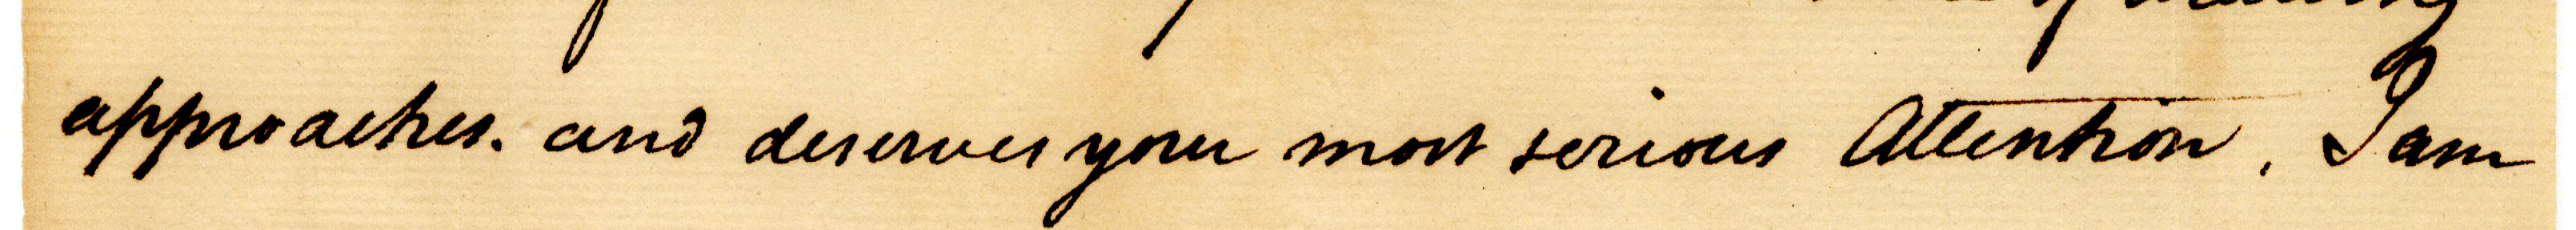approaches and deserves your most serious attention. I am
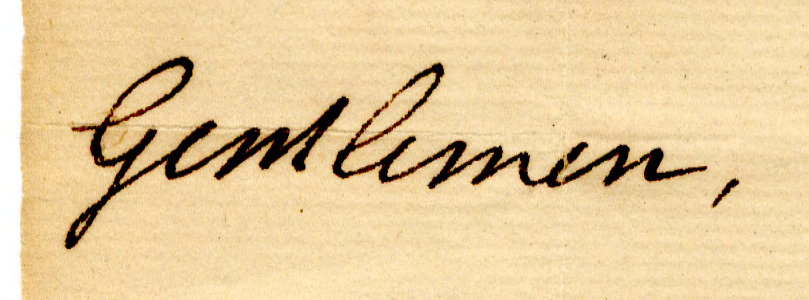Gentlemen,
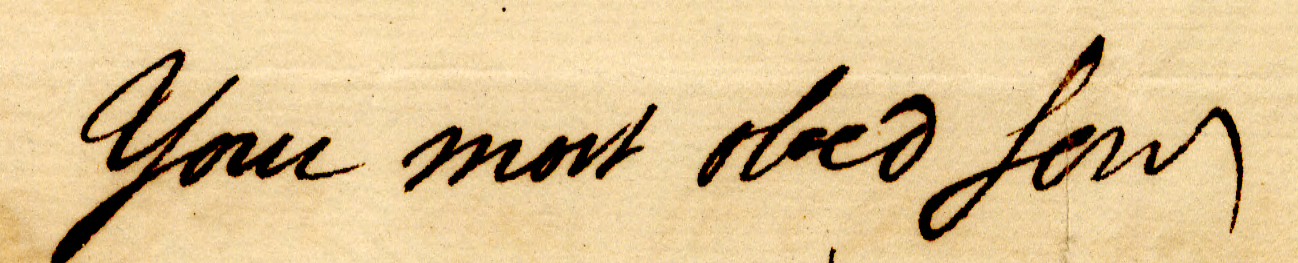Your most obed serv
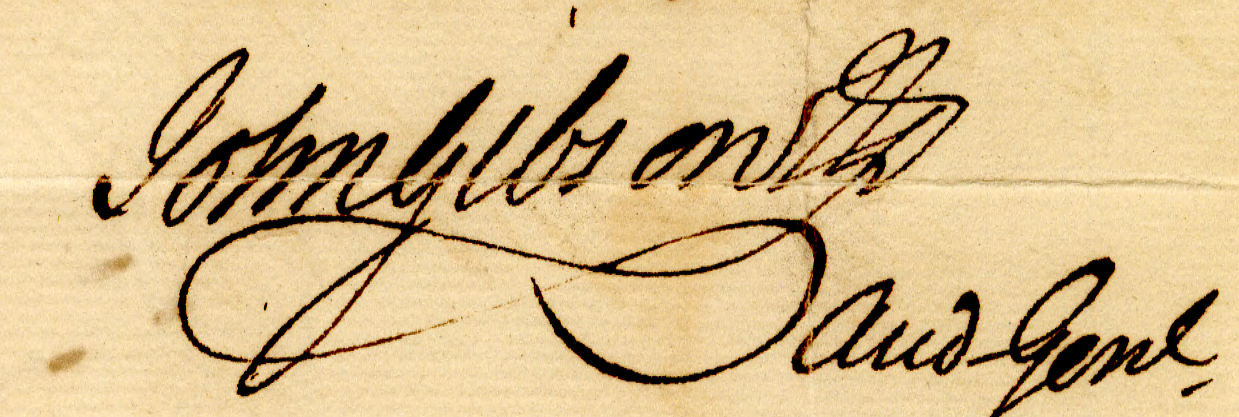John Gibson Esq
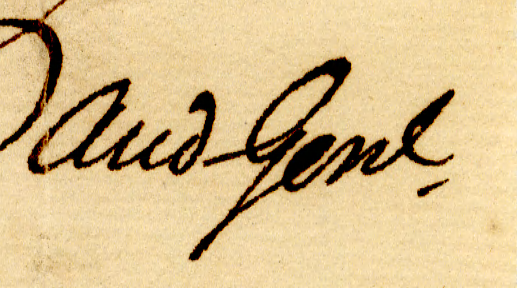and Gen^l.
